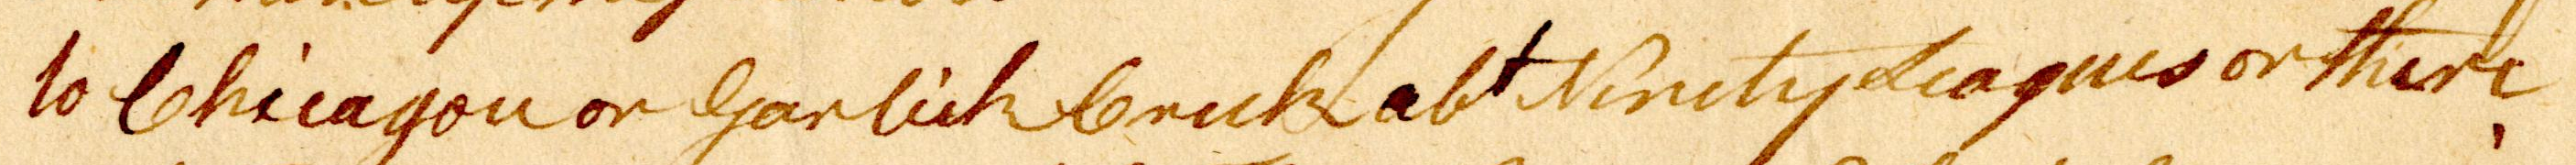to Chicago or Garlick Creek ab^t Ninty Leagues or there
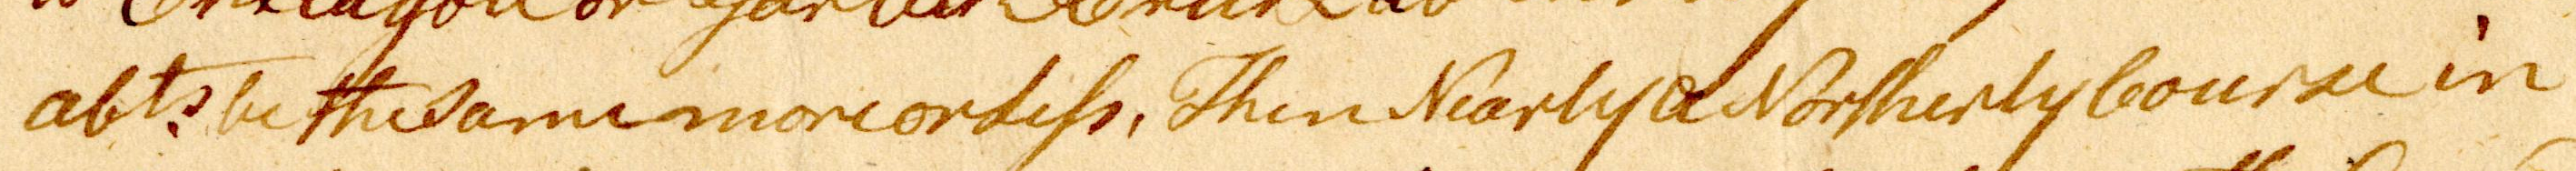ab^ts. be the same more or less, There nearly a Northerly Course in
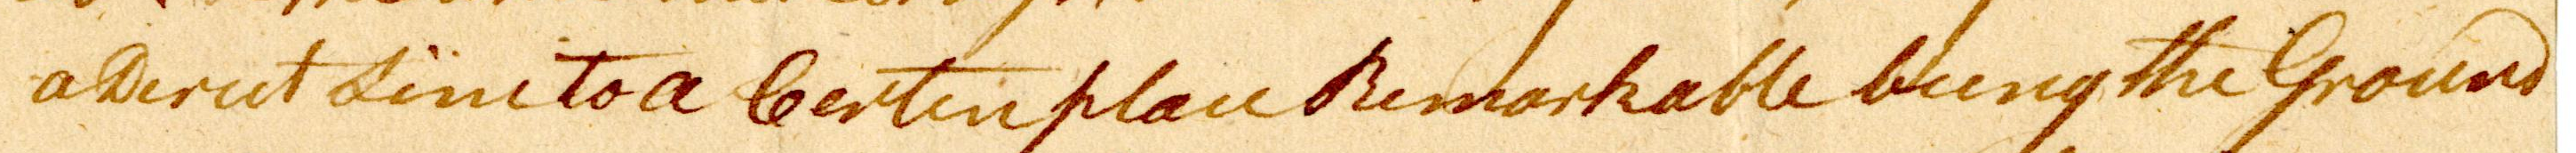a Derect Line to a Certin place Remarkable being the Grounds
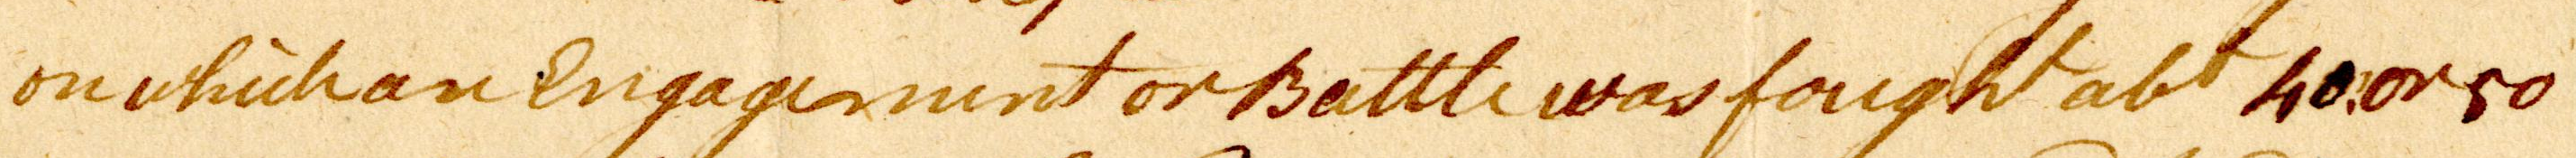on which an Engagement or Battle was fought ab^t 40 or 50
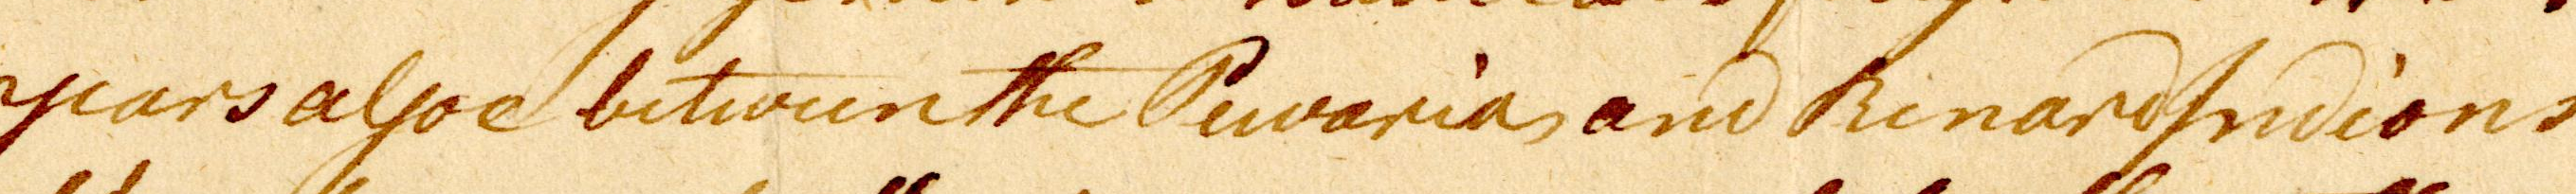years ago between the Pewania, and Renard indians
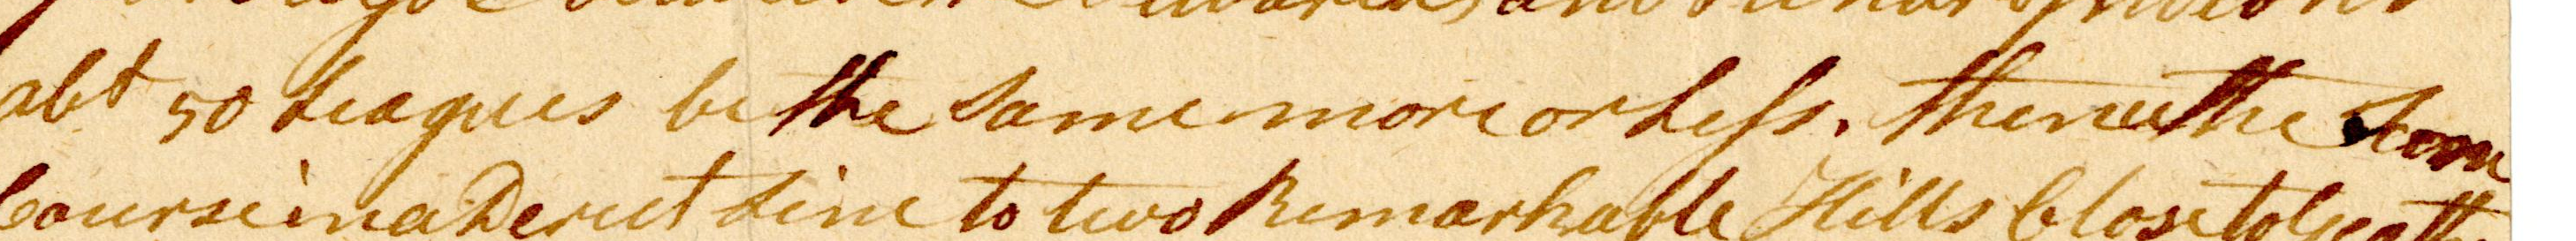ab^t 50 Leagues be the same more or less, thence the same
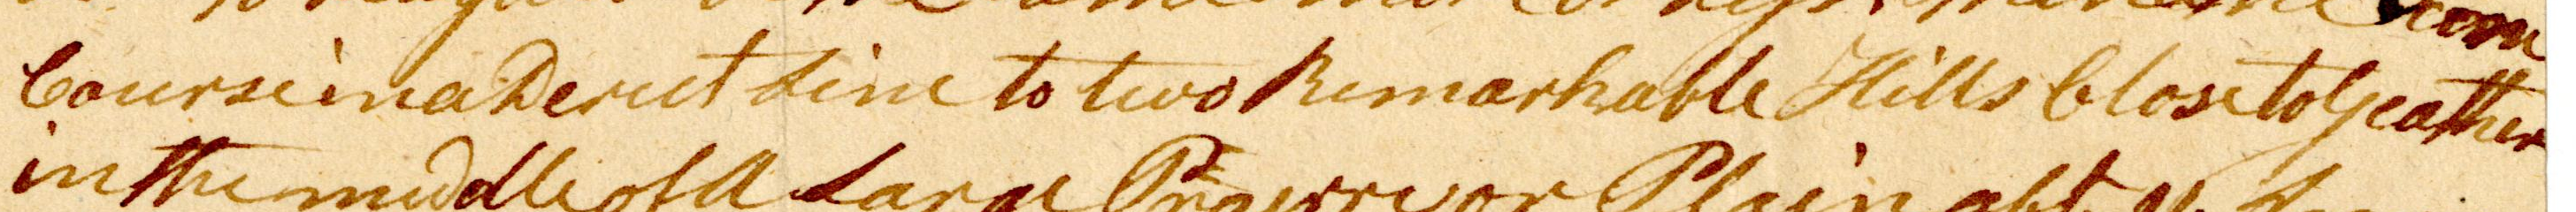Course in a Derect line to two Remarkable Hills Close togeather
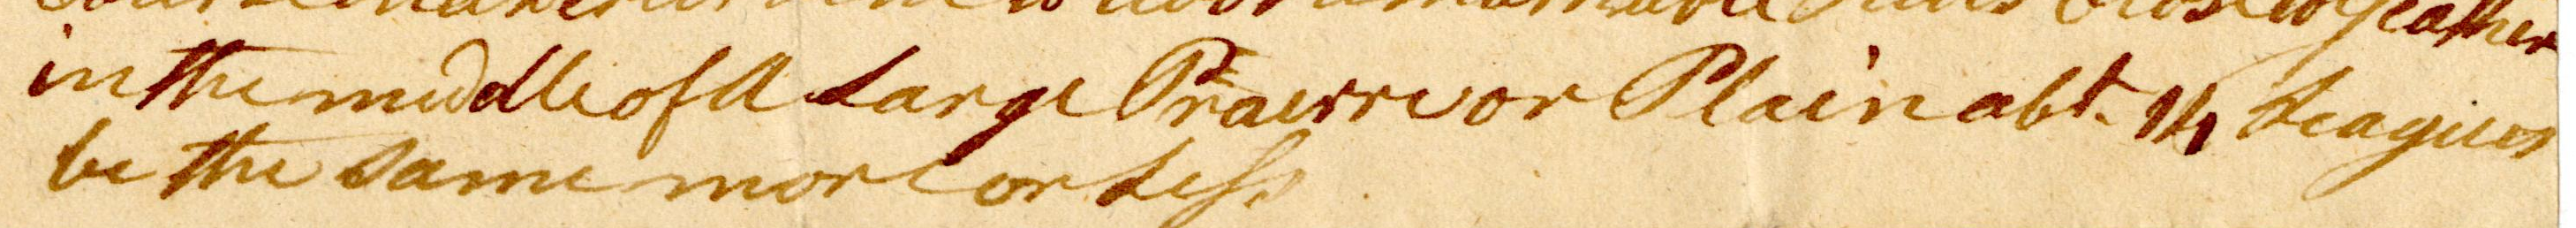in the middle of A Large Prairie or Plain ab^t. 14 Leagues
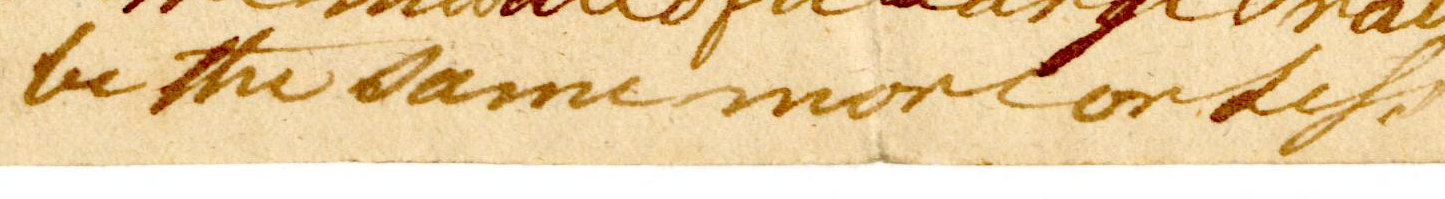be the same more or less
